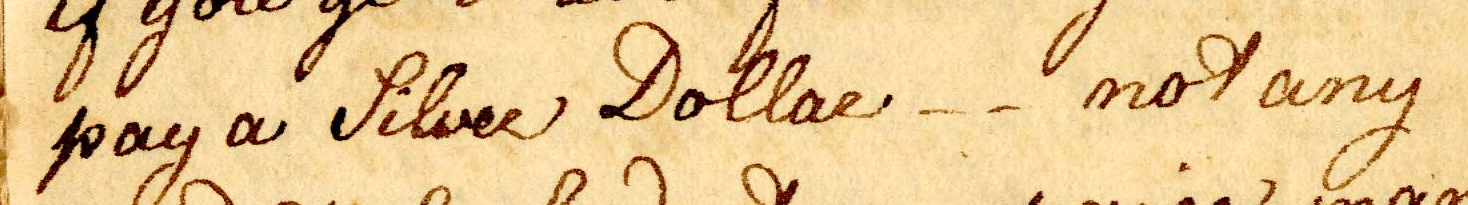pay a Silver Dollar-- not any
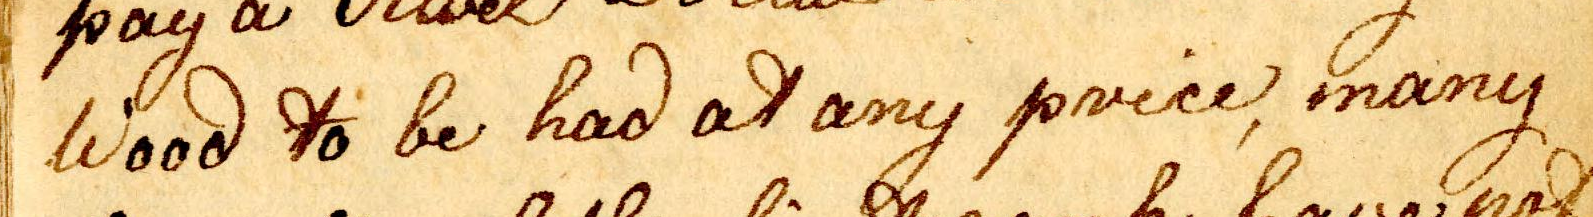Wood to be had at any price, many
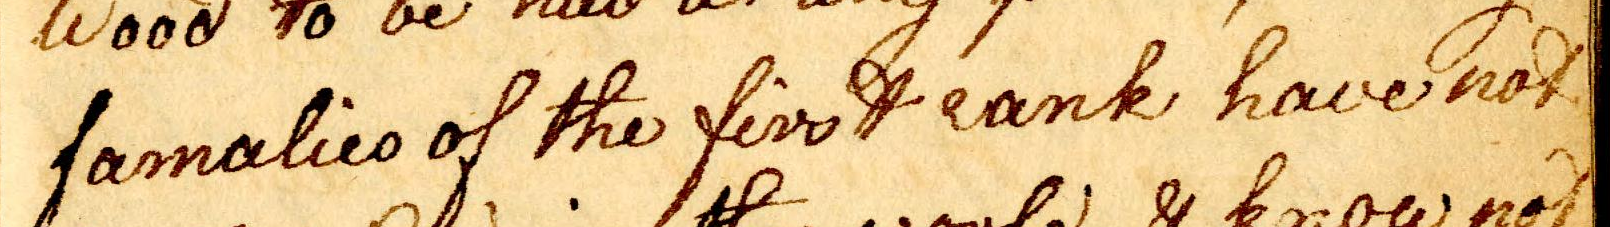famalies of the first rank have not
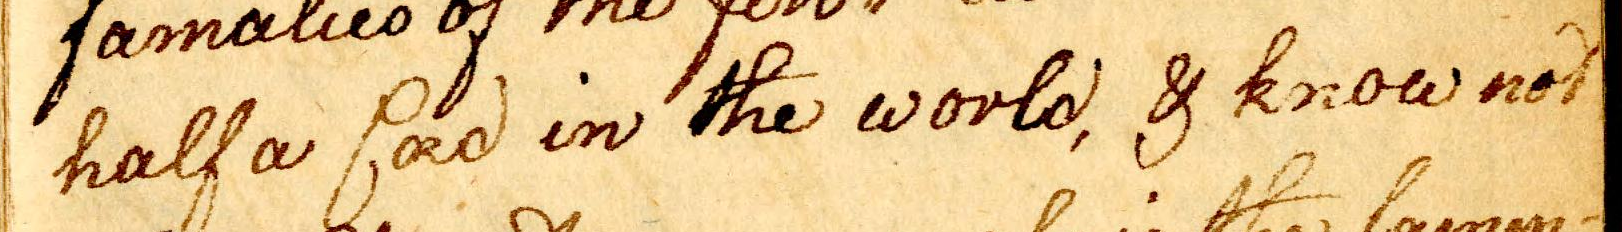half a Cord in the world, & know not
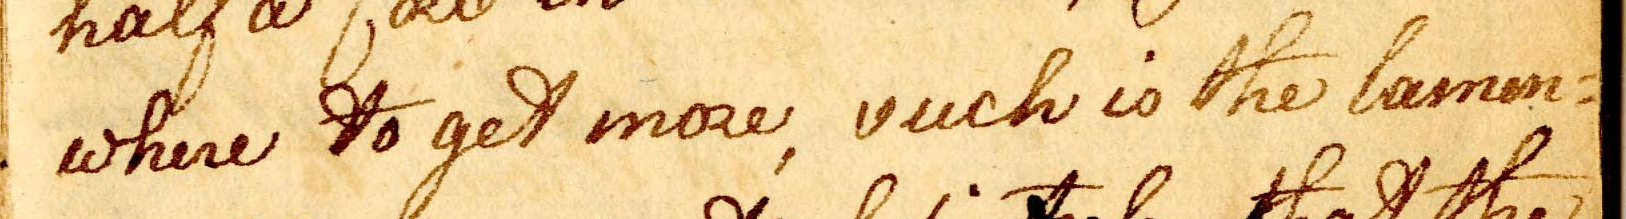where to get more such is the lamen-
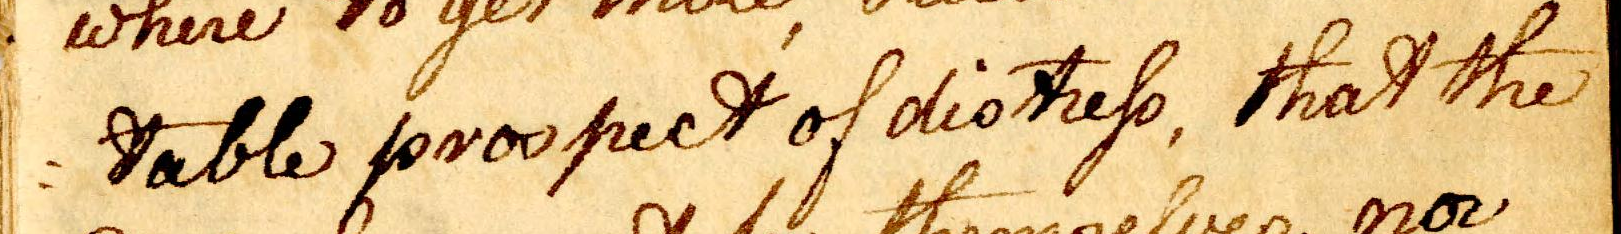-table prospect of distress, that the
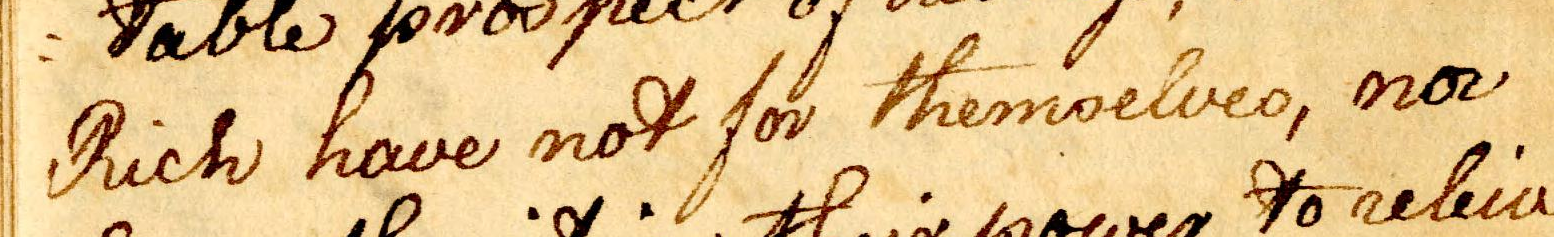Rich have not for themselves, nor
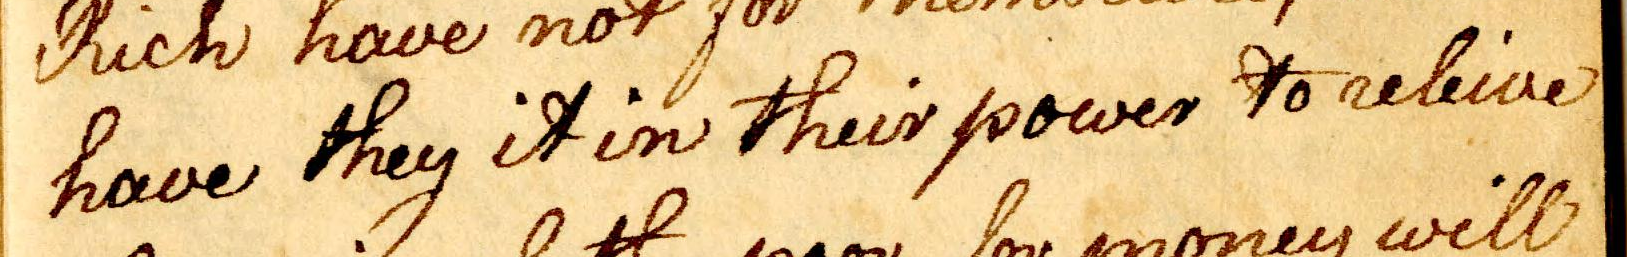have they it in their power to releive
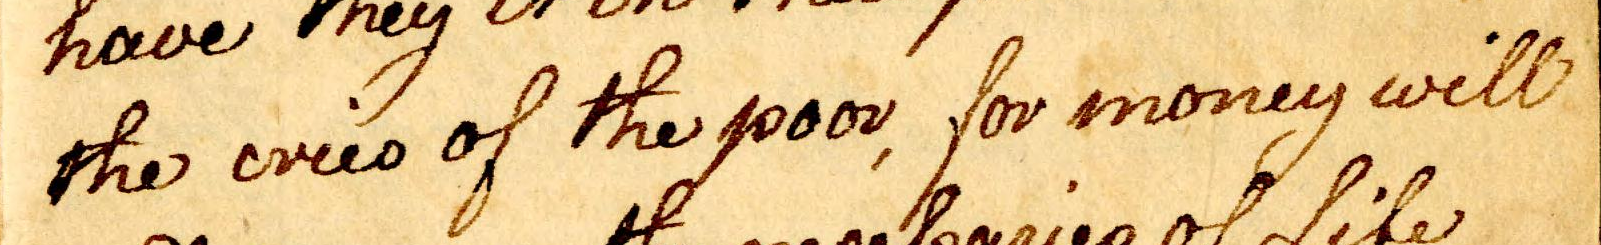the cries of the poor for money will
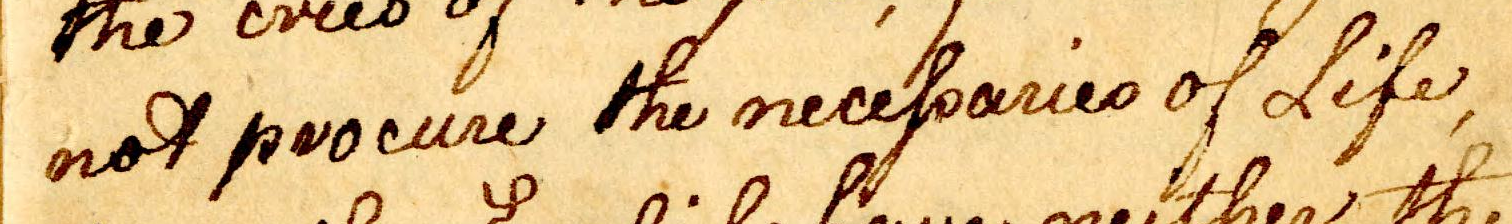not procure the necessaries of Life,
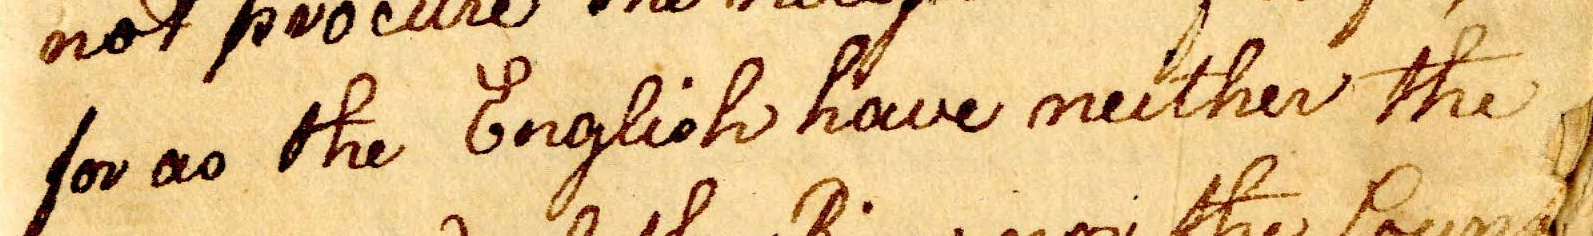for as the English have neither the
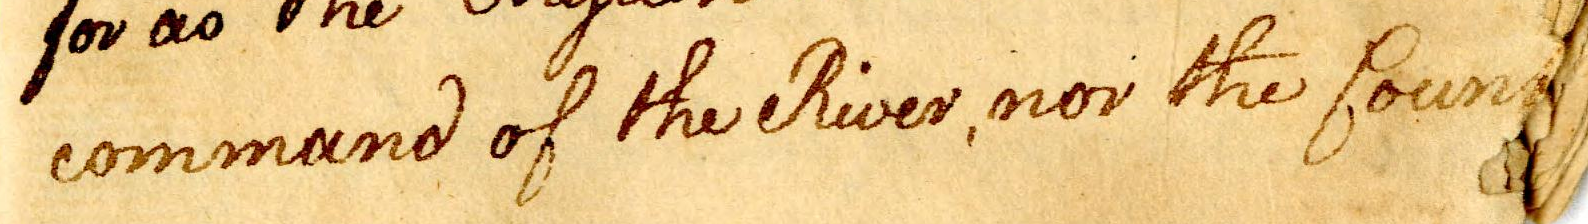command of the River, nor the Coun
